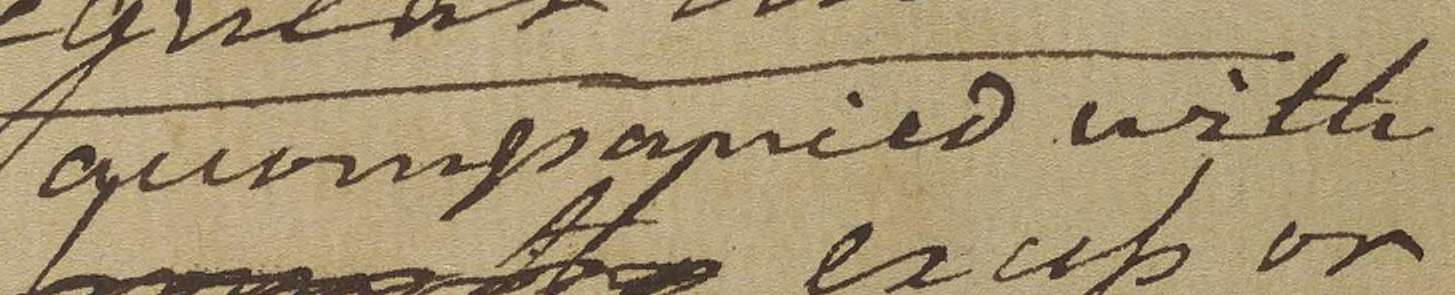accompanied with
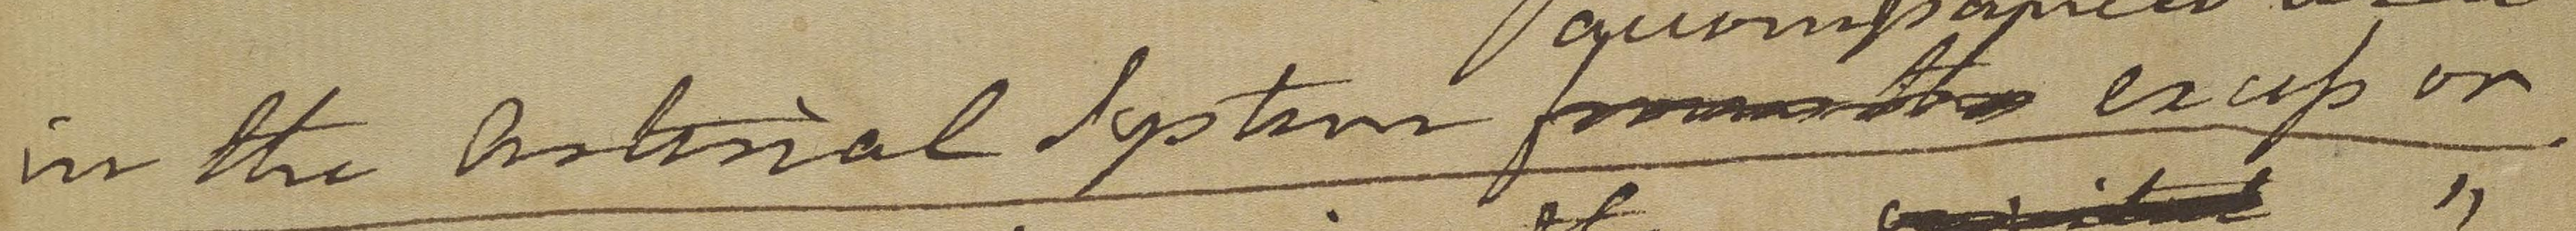in the arterial system [_________] excess or
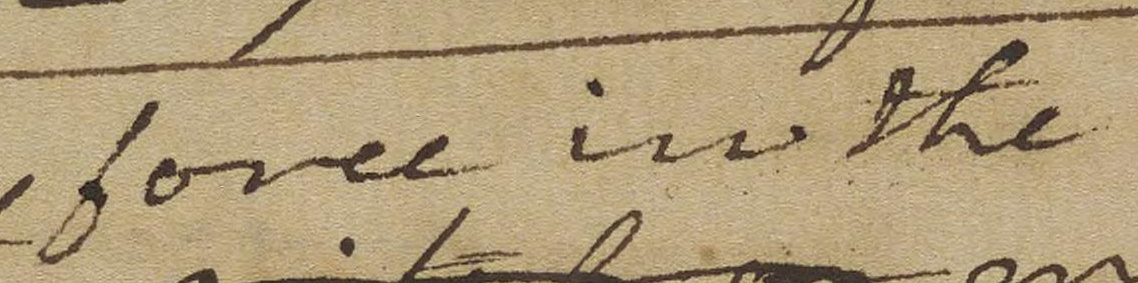force in the
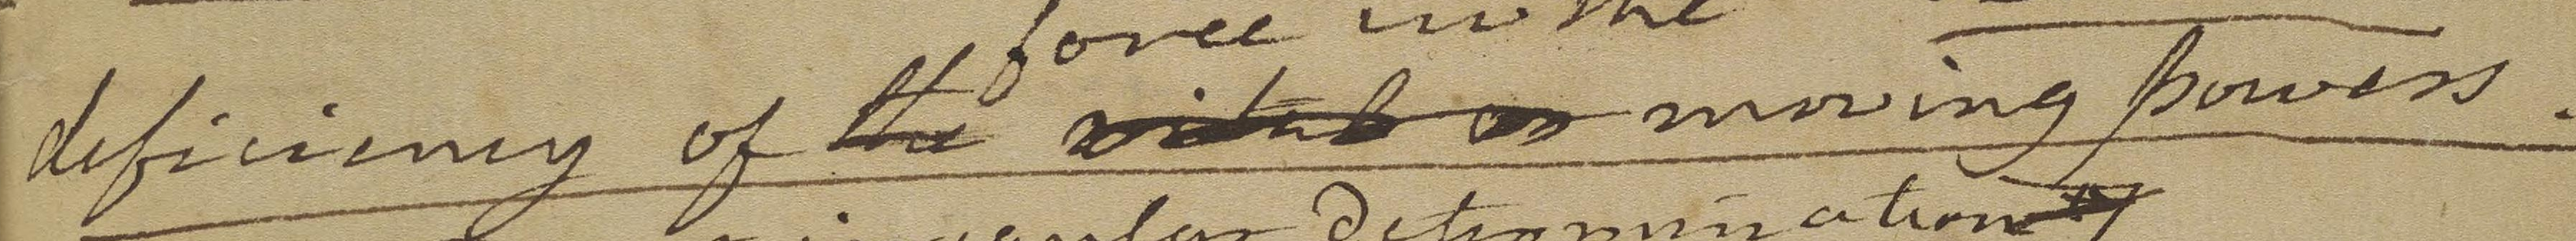deficiency of the [_____] moving powers.
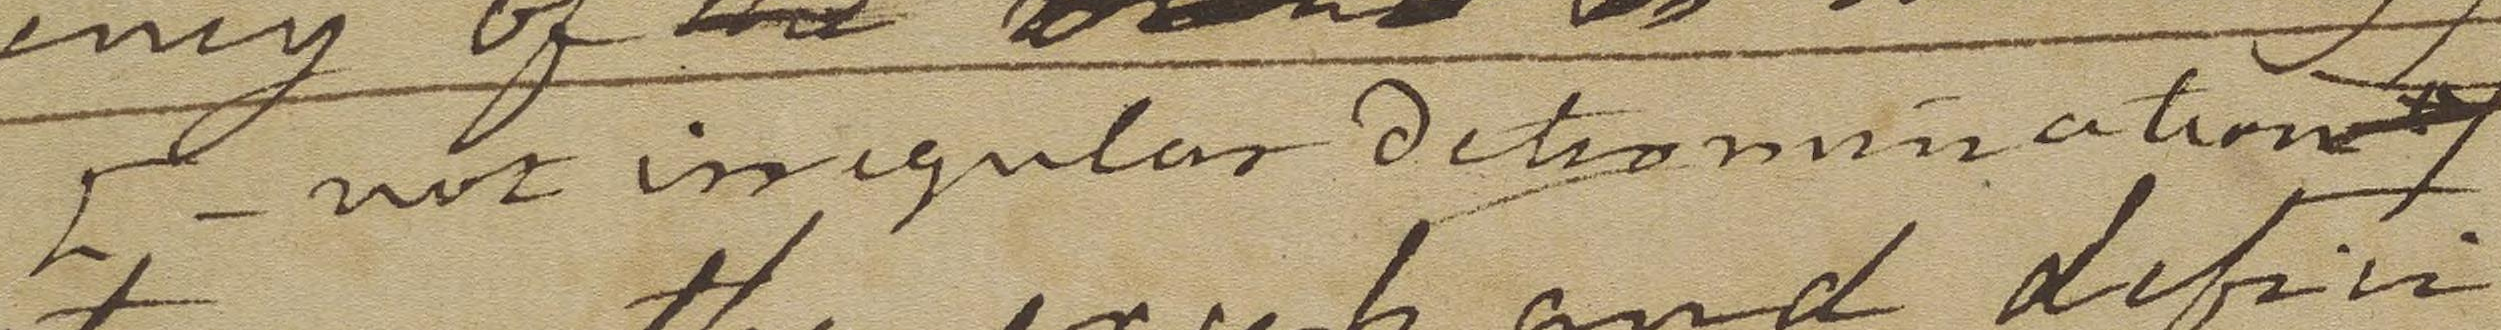(- not irregular determination)
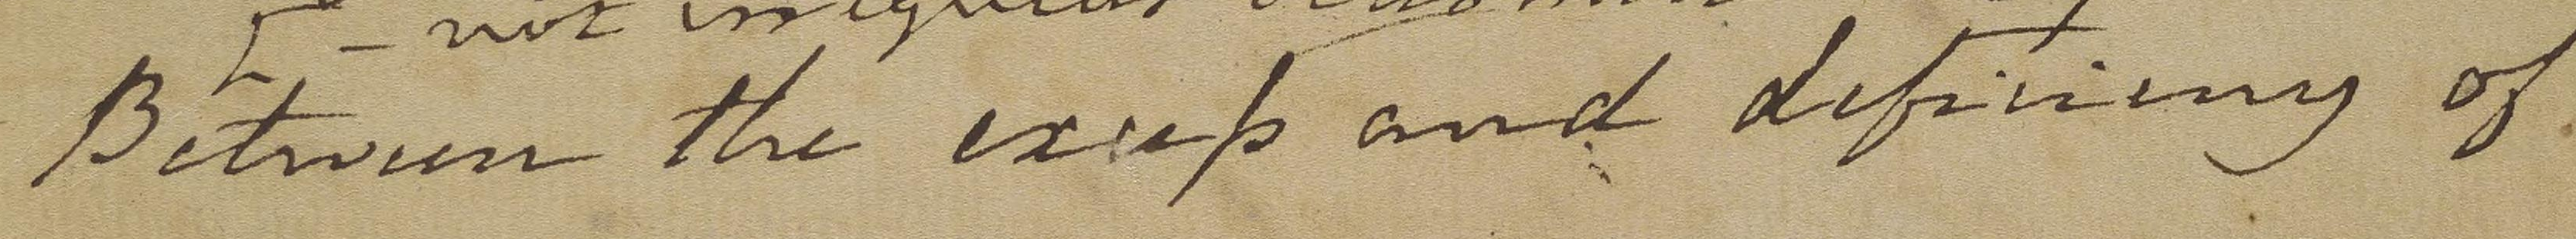Between the excess and deficiency of
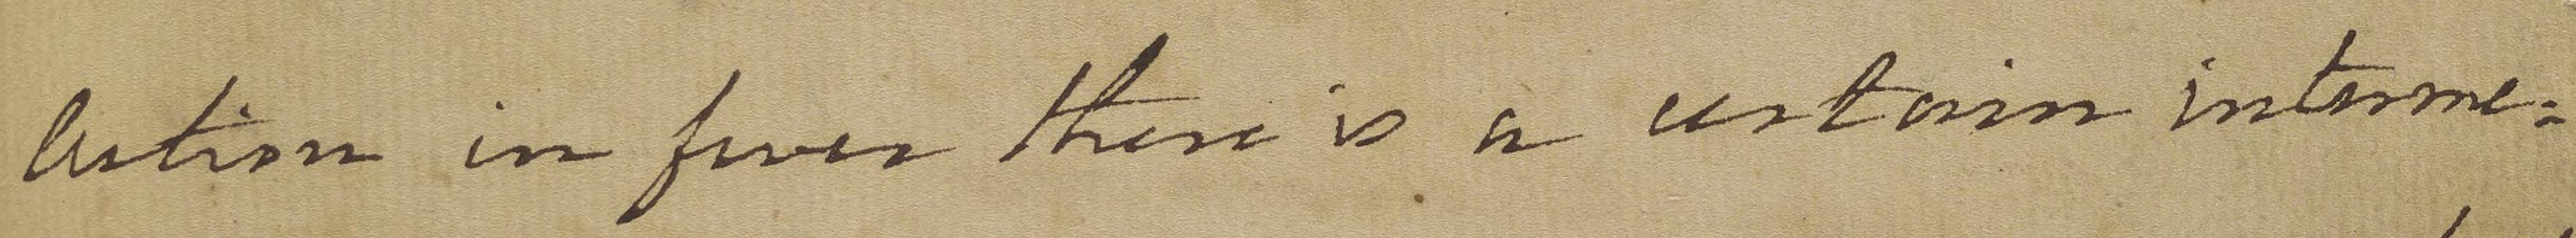Action in fever there is a certain interme-
